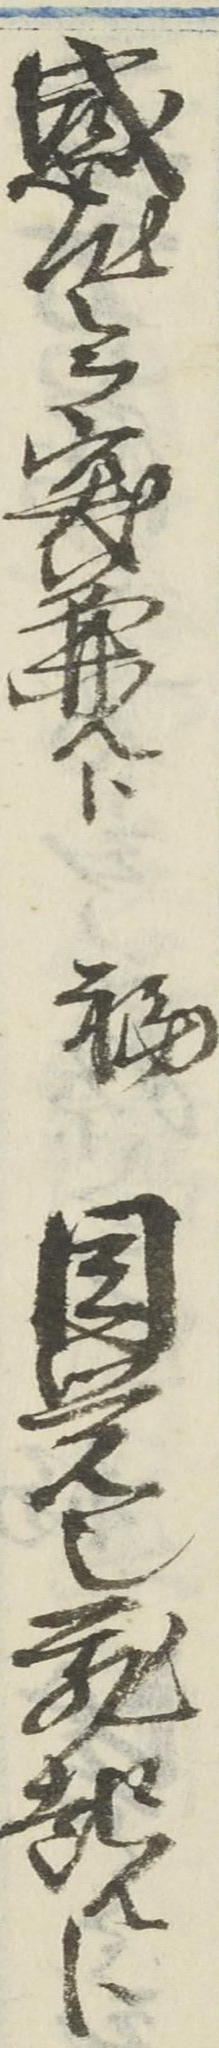感心シテ突兼ルト福目覚シ飛起ルト
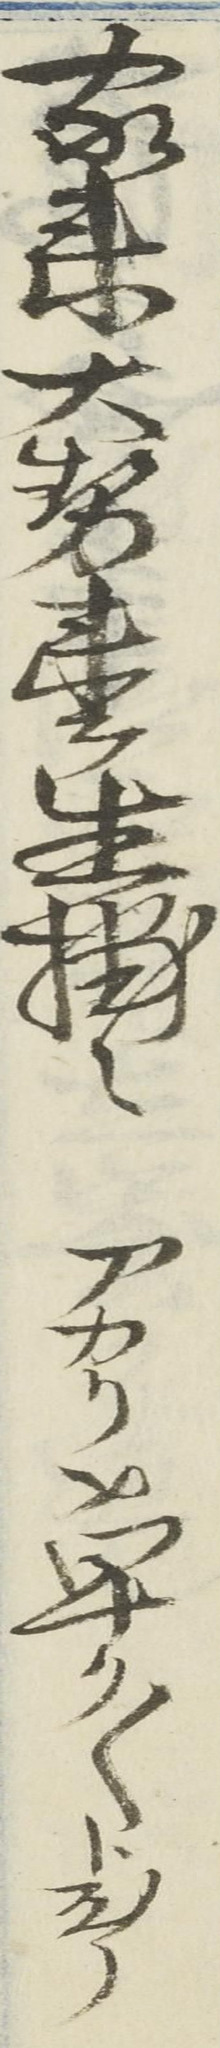家来大勢来テ生捕シアカリヲ早ク〳〵ト云ウ
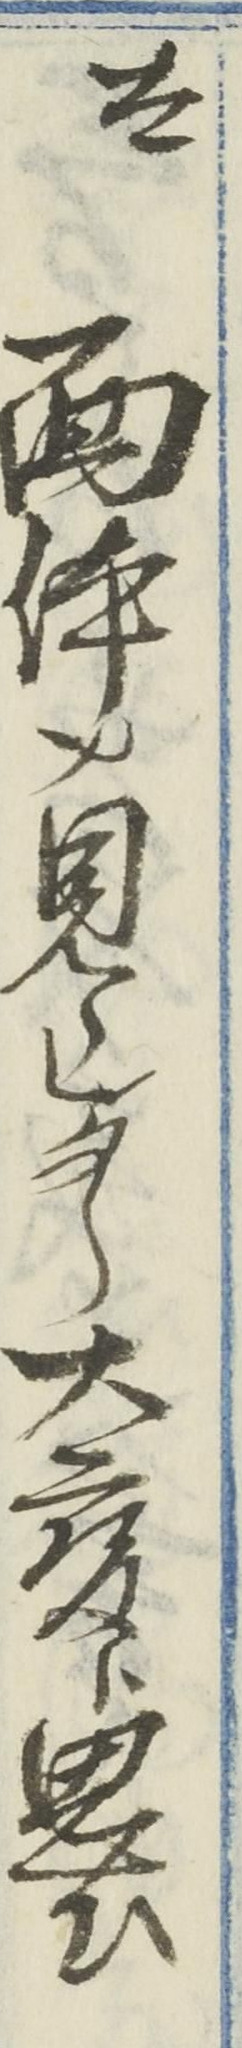太面体ヲ見ラレタら大変ト思ヒ
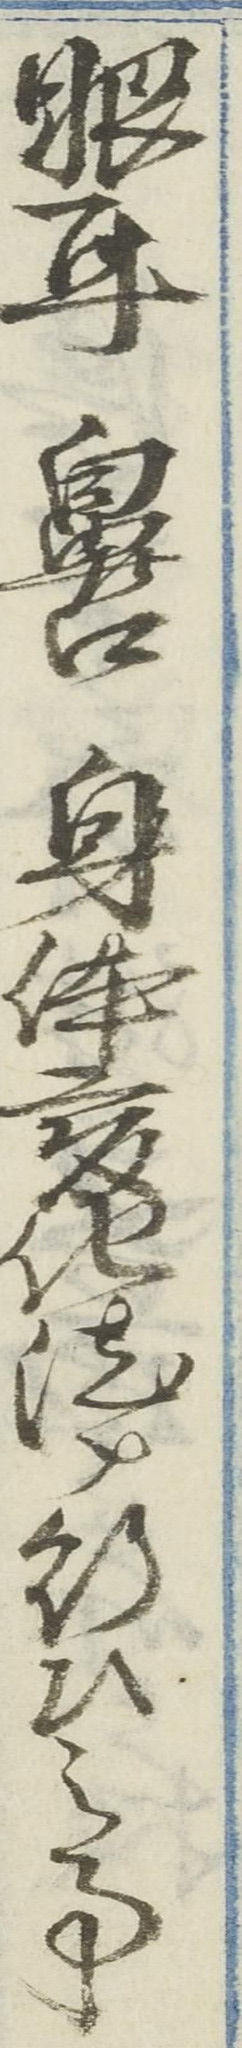眼耳鼻口身体変化法ヲ行ひ之事
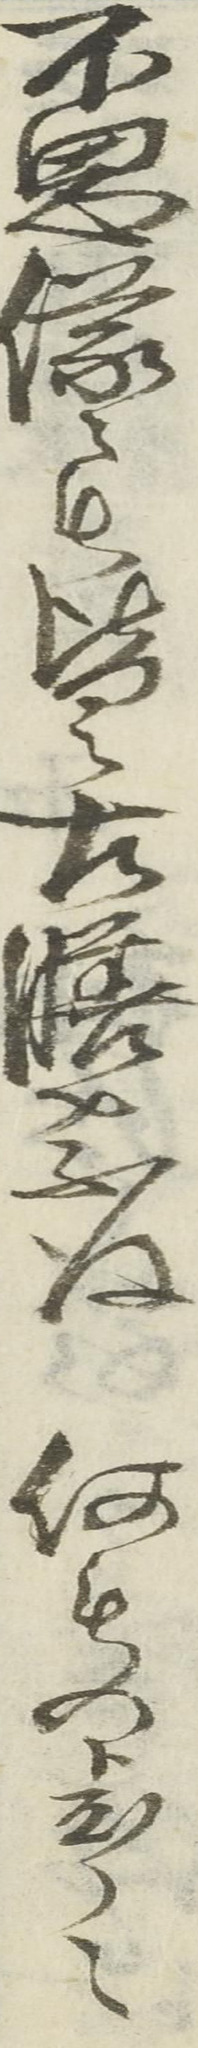不思議ニモ皆々左膳ヲ不存何モノト云ウ也
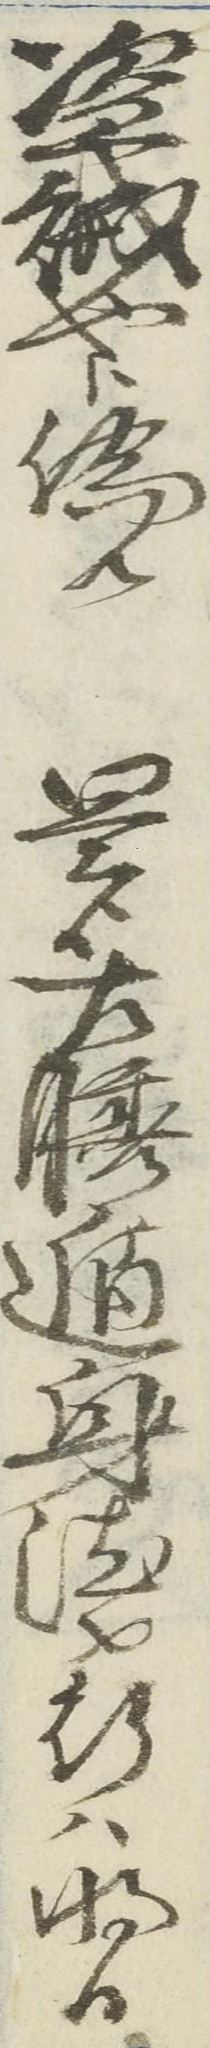盗賊也ト偽ル是ゟ左膳遁身法ヲ行ハ明日
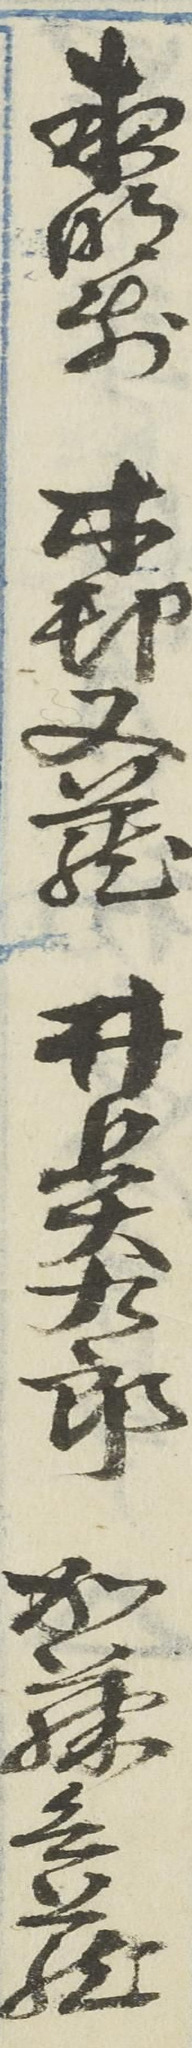夜明前木邨又蔵井上大九郎加藤兵蔵
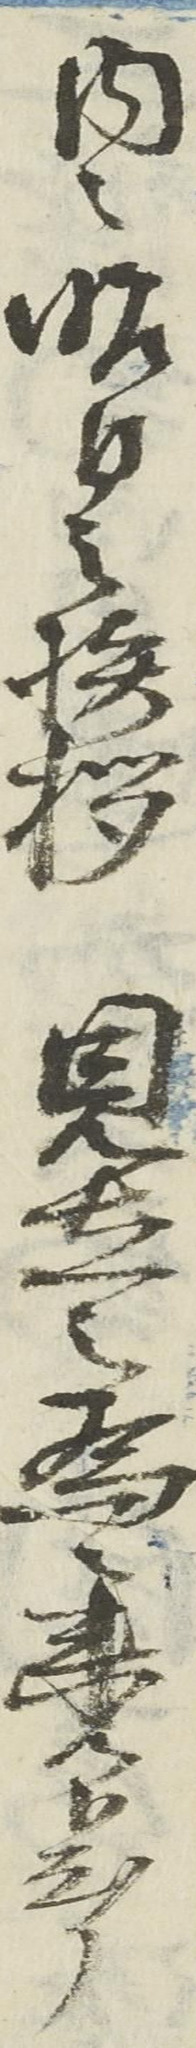内〻昨日之挨拶見立之為ニ来ルト云ウ
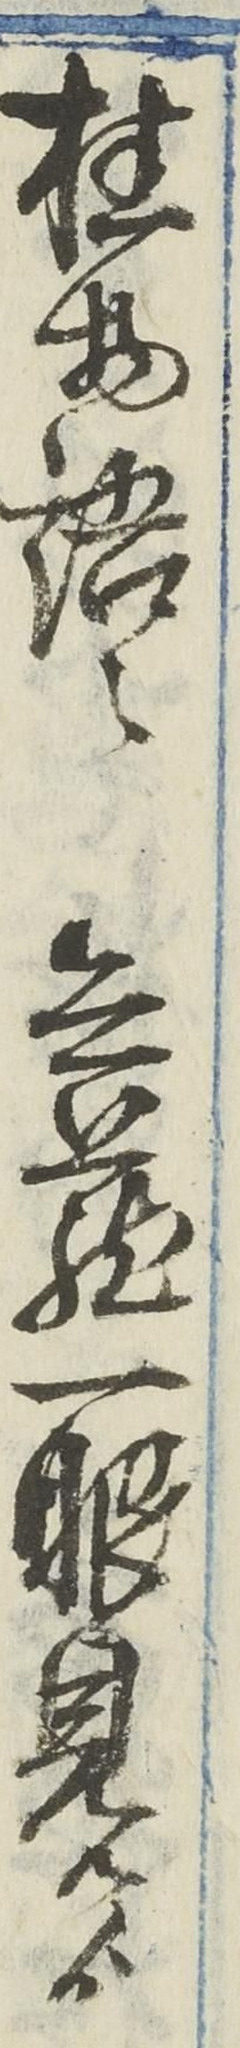桂物語ニ兵蔵一眼見ルゟ
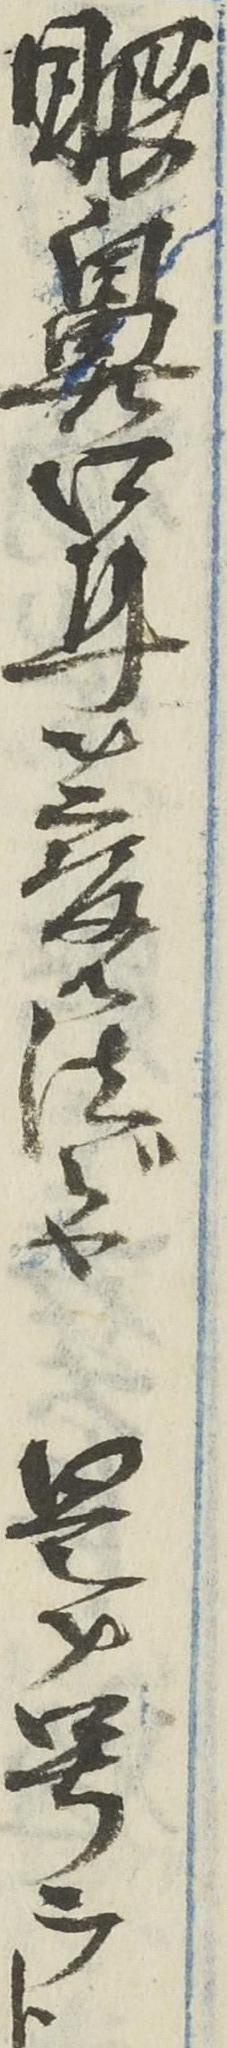眼鼻口耳ヲ変ル法ジヤ是ヲ号テト
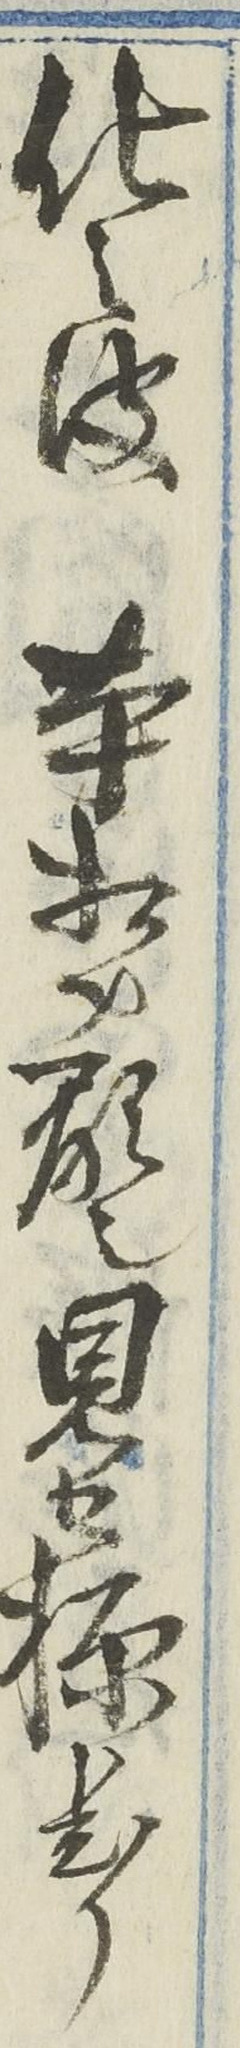化之皮本相ヲ顕シ見セ様ト云ウ
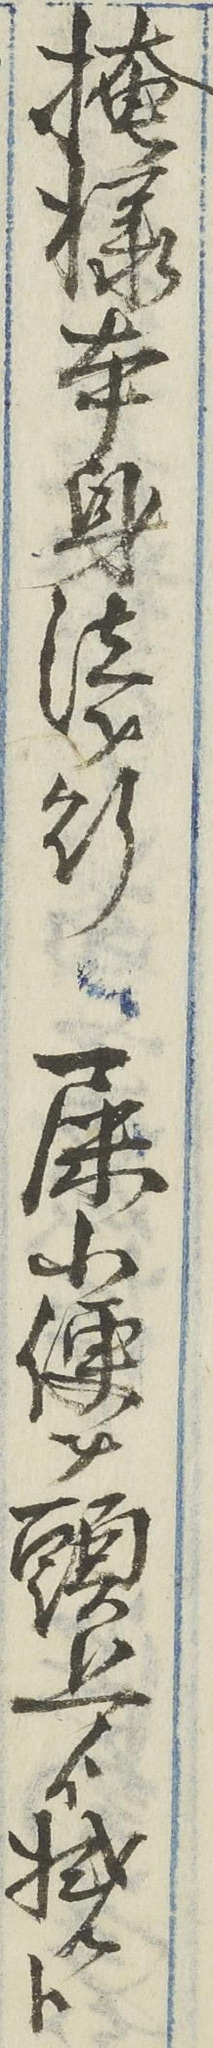掩様本身法ヲ行屎小便ヲ頭上ゟ掛ルト
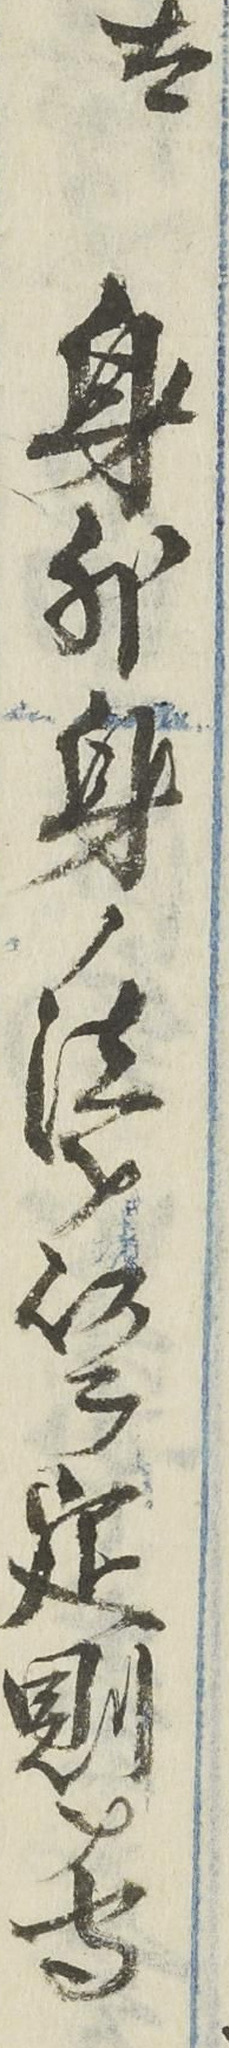太身外身ノ法ヲ以テ定則ヲ守
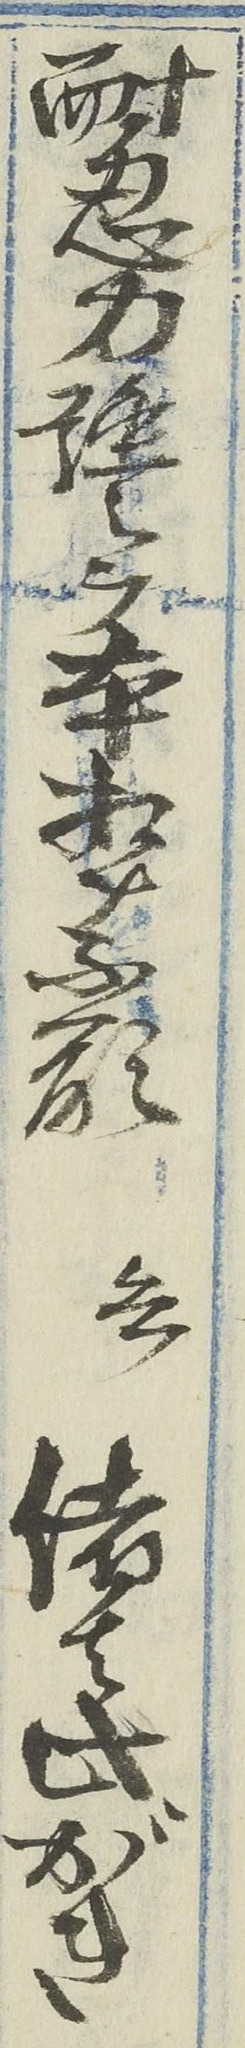耐忍力強シテ本相ヲ不顕兵偖ハ此がき
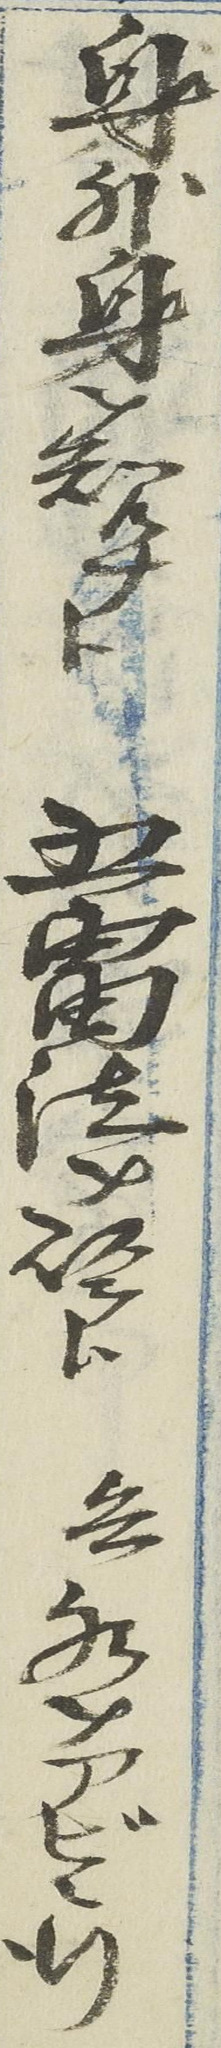身外身ヲ知ルナト五雷法ヲ以テト兵水ヲアビニ行
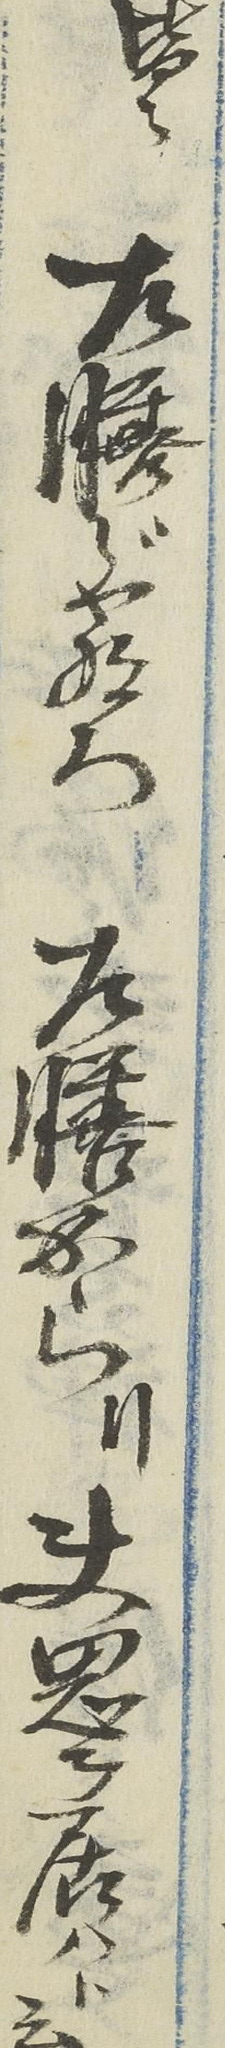皆々左膳ジヤ有ろ左膳から？夫思テ居ハト云
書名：伏水大地震
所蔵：東京大学地震研究所図書室 Earthquake Research Institute Library, The University of Tokyo, JAPAN
